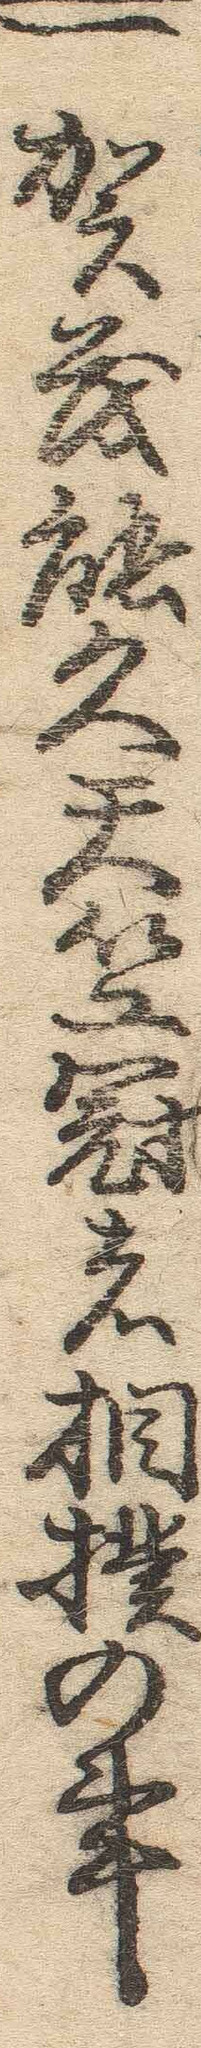一賀茂能久天竺冠者相撲の事
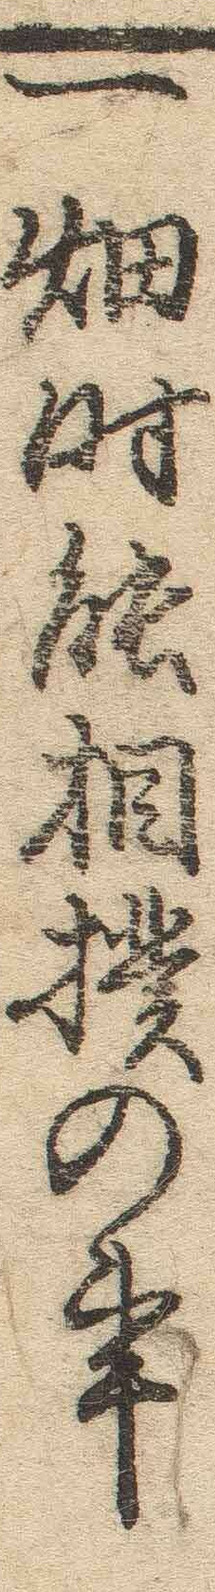一畑時能相撲の事
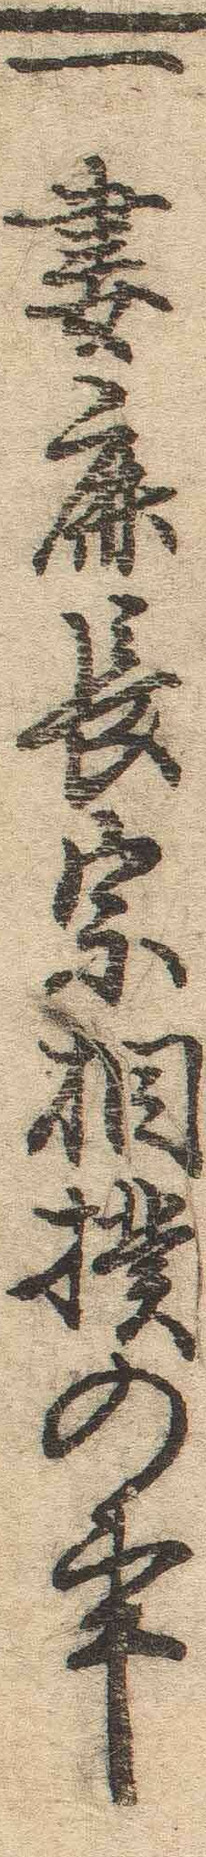一妻鹿長宗相撲の事
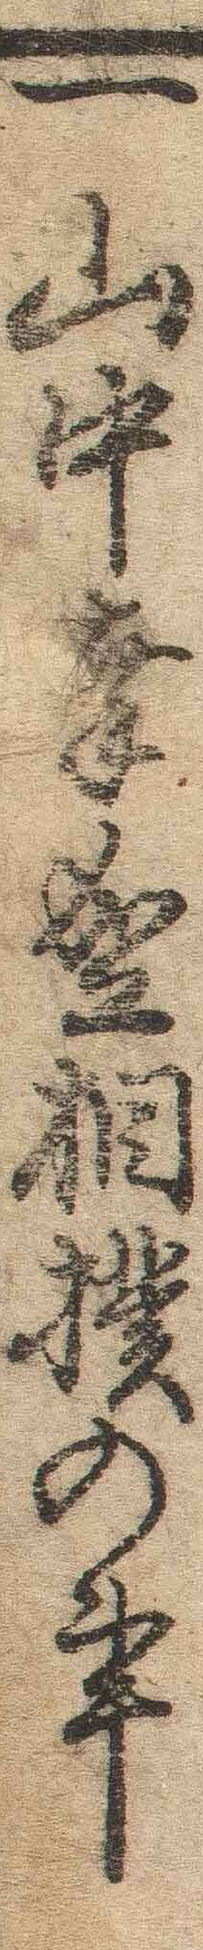一山中幸盛相撲の事

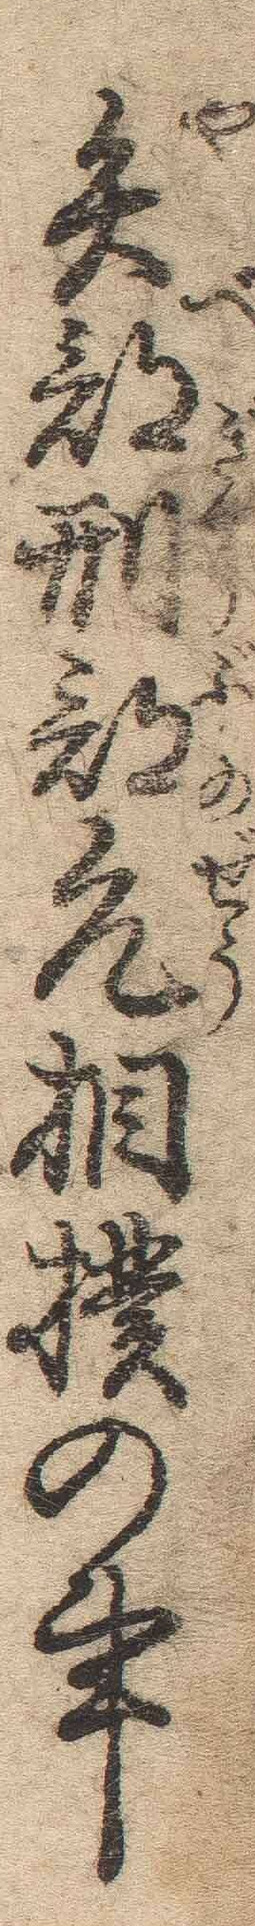一矢部刑部允相撲の事
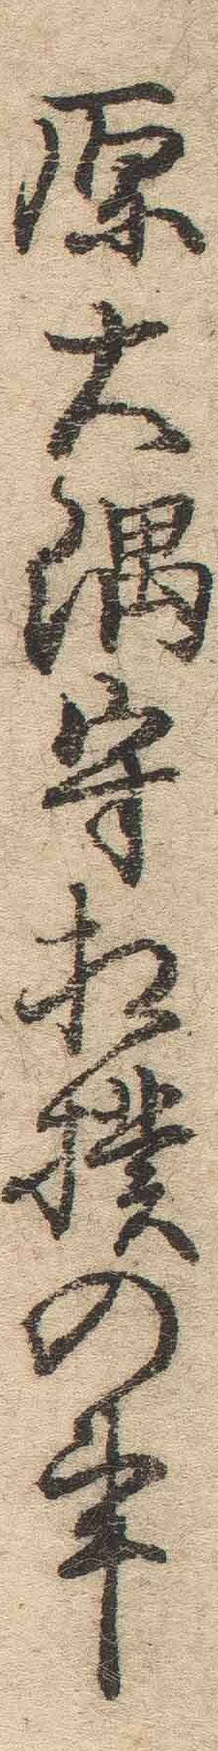一原大隅守相撲の事
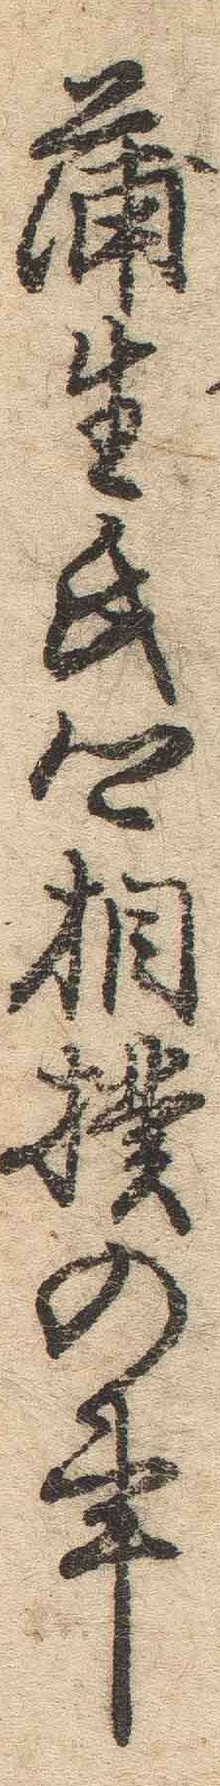一蒲生氏郷相撲の事
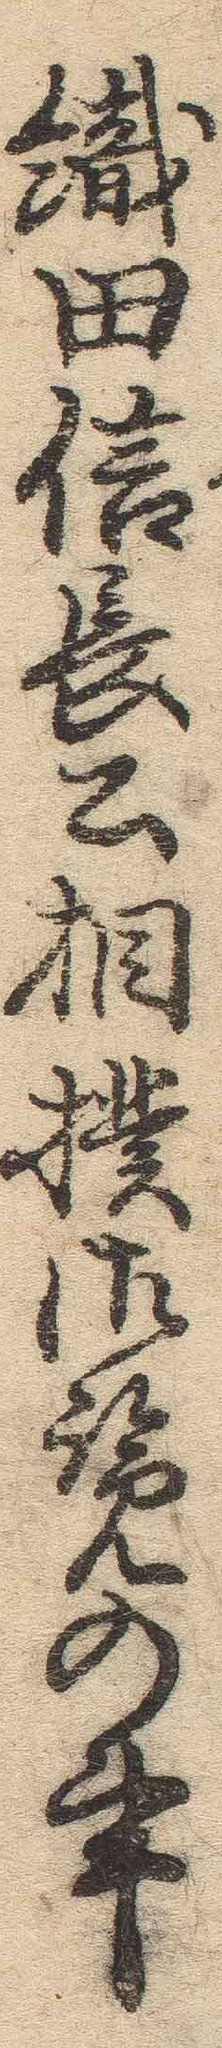一織田信長公相撲御覧の事
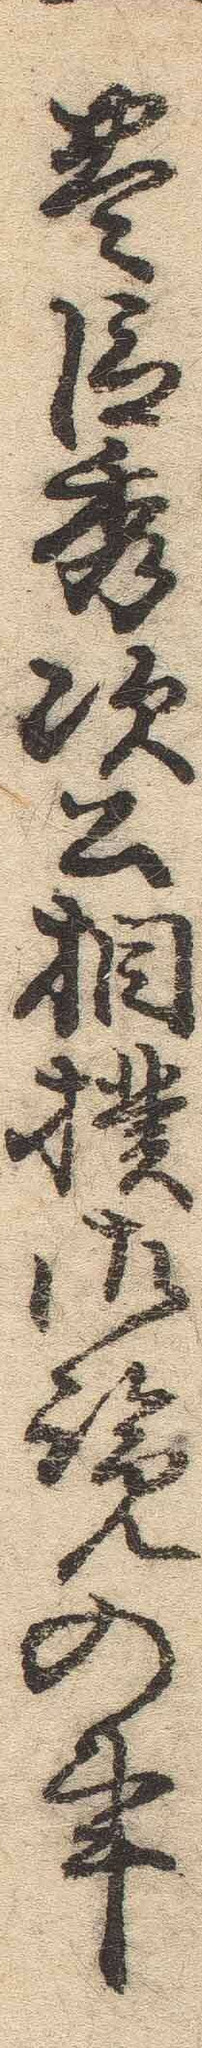一豊臣秀次公相撲御覧の事
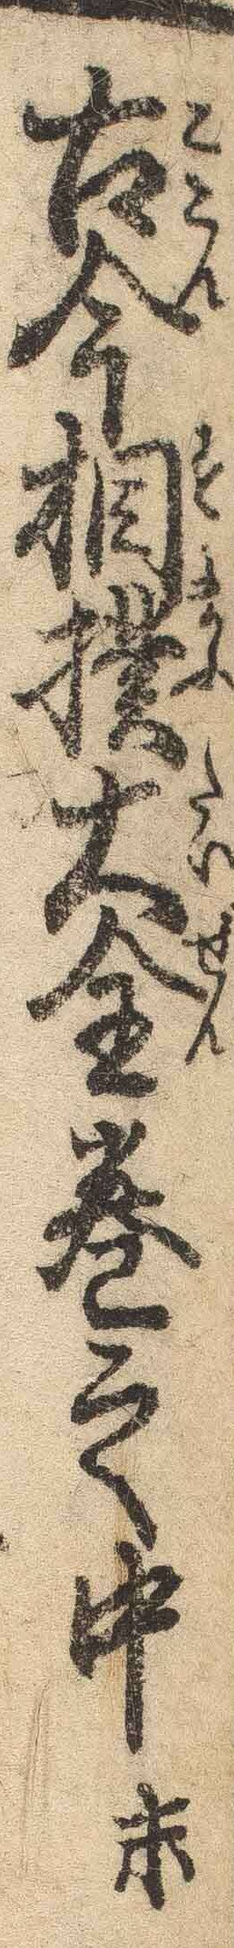古今相撲大全巻之中末
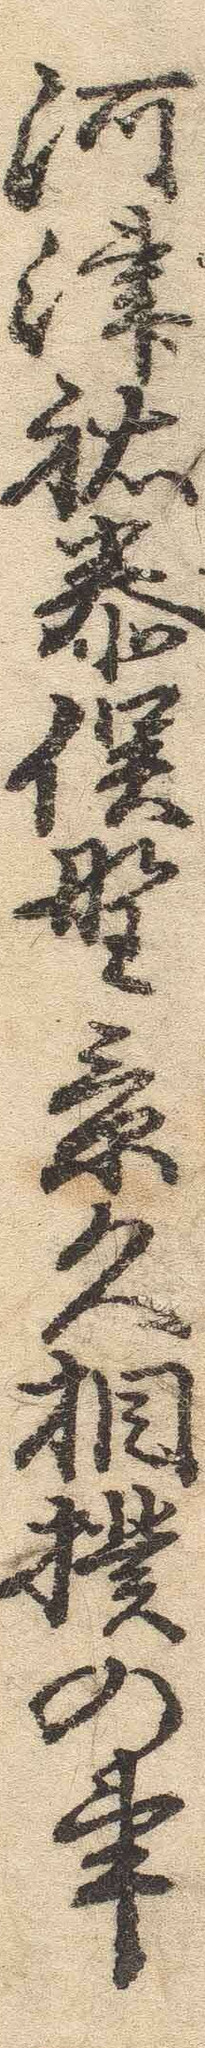河津祐泰俣野景久相撲の事
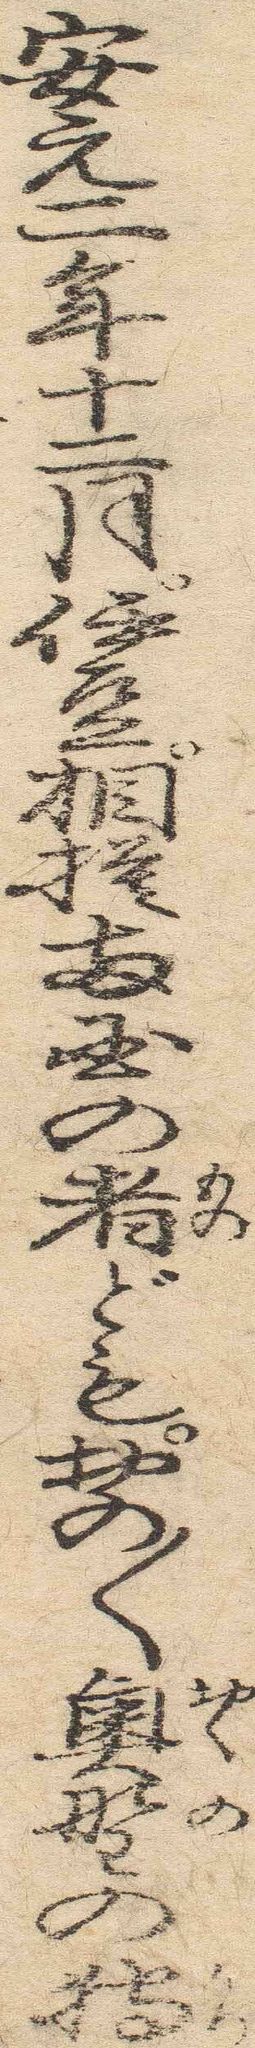安元二年十二月。伊豆。相模両国の者ども。おの〳〵奥野の狩
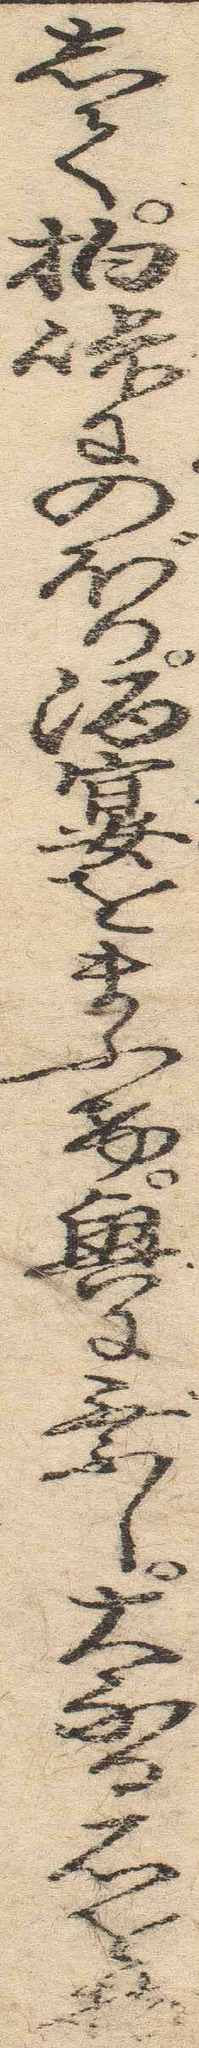して。柏峠にのぼり。酒宴をまふけ。興に乗し。大なる石を持
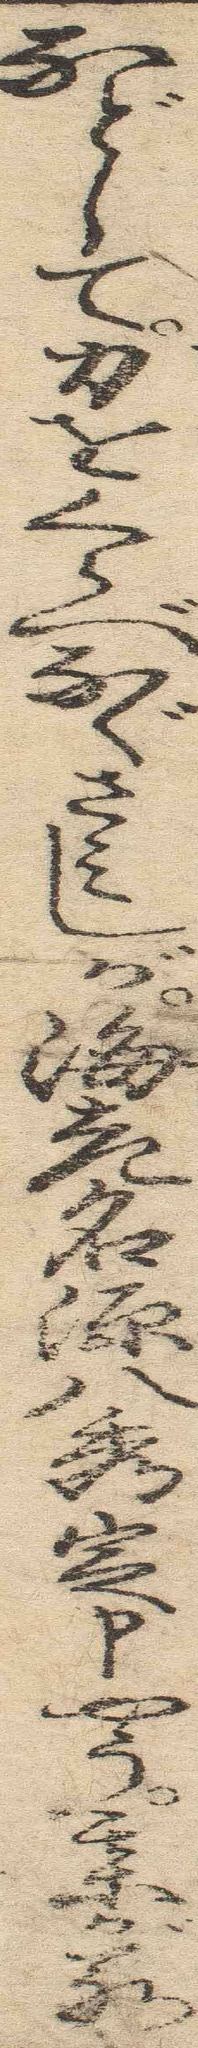などして。力をくらべなぐさみしが。海老名源八秀定申やう。某が若
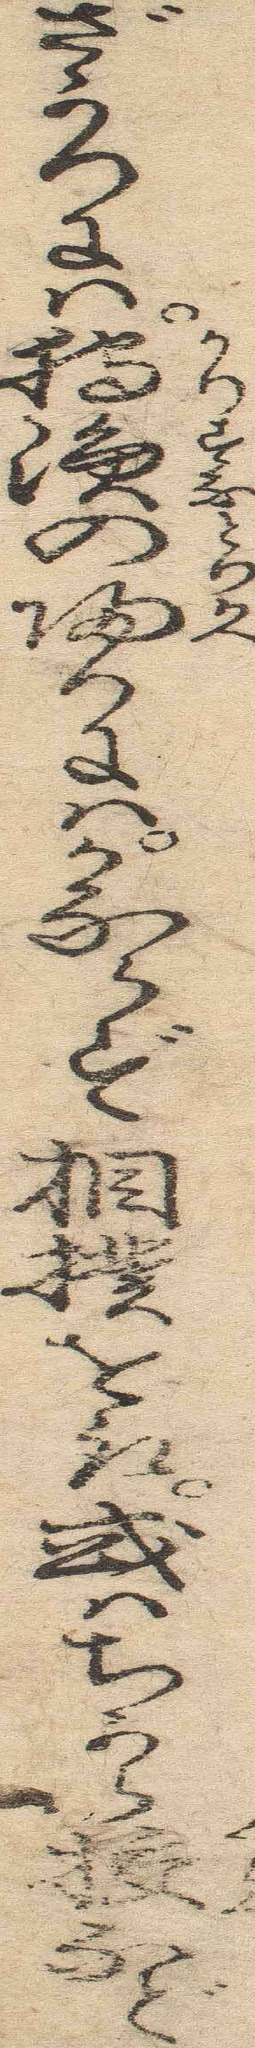ざかりには。狩漁の帰りには。かならず相撲を取。或はちから挍など
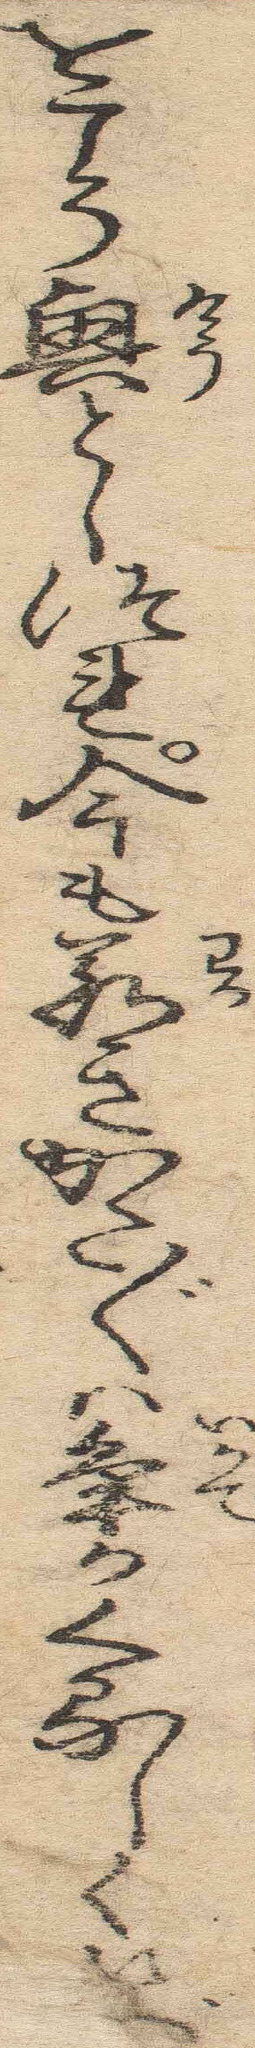をこそ興としつれ。今も若きかた〴〵は争かくるしく。
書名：古今相撲大全
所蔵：東京学芸大学附属図書館 国文学研究資料館
